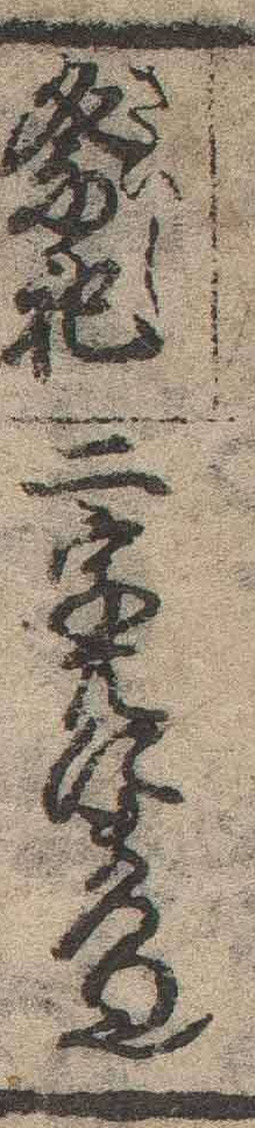祭祀二字共にまつる也
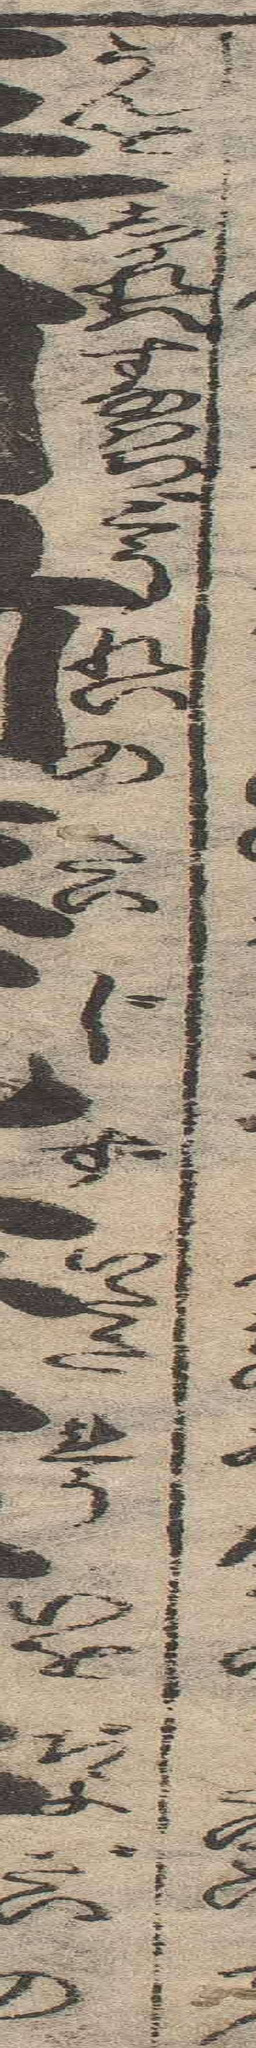うんをしかれはすなはちごうれいのさいじずいたされういをぢよざいの
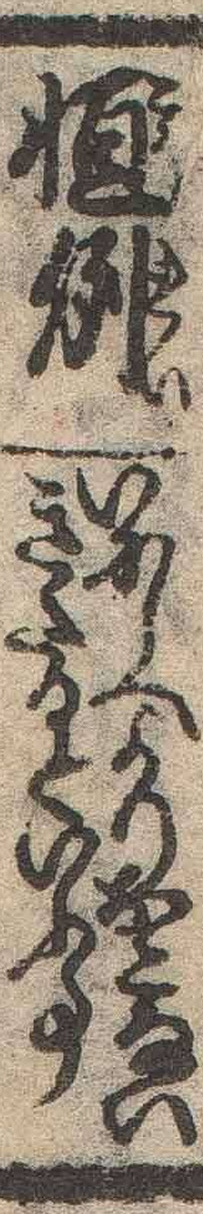恒例いにしへよりおこない
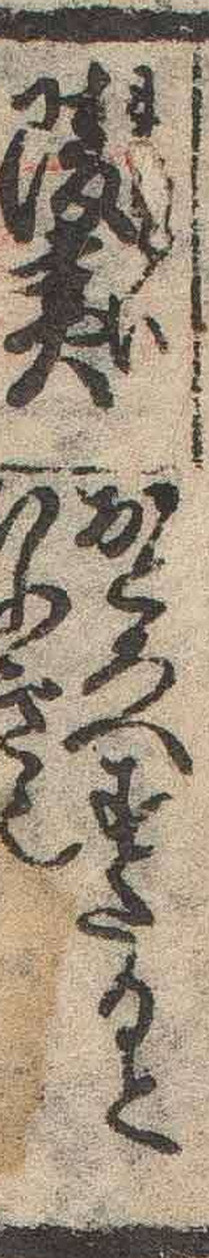陵夷おとろへすたると
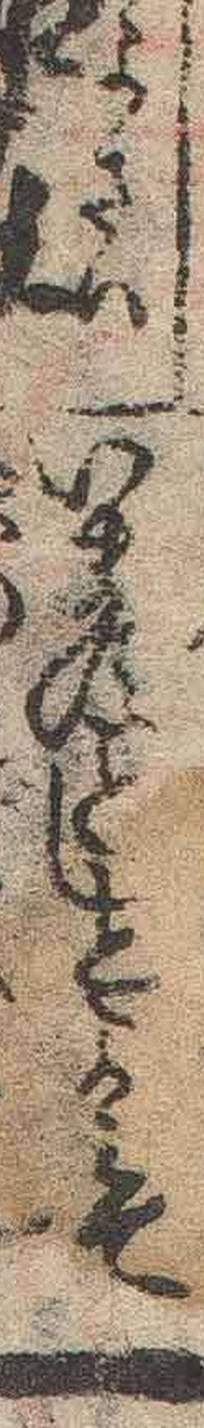如在いますことしとよみて
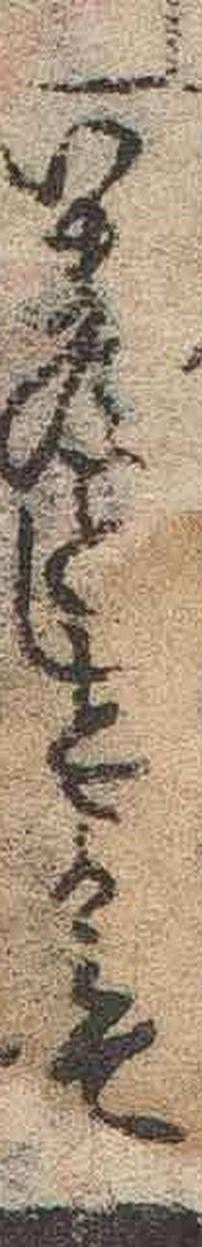如在いますことしとよみて
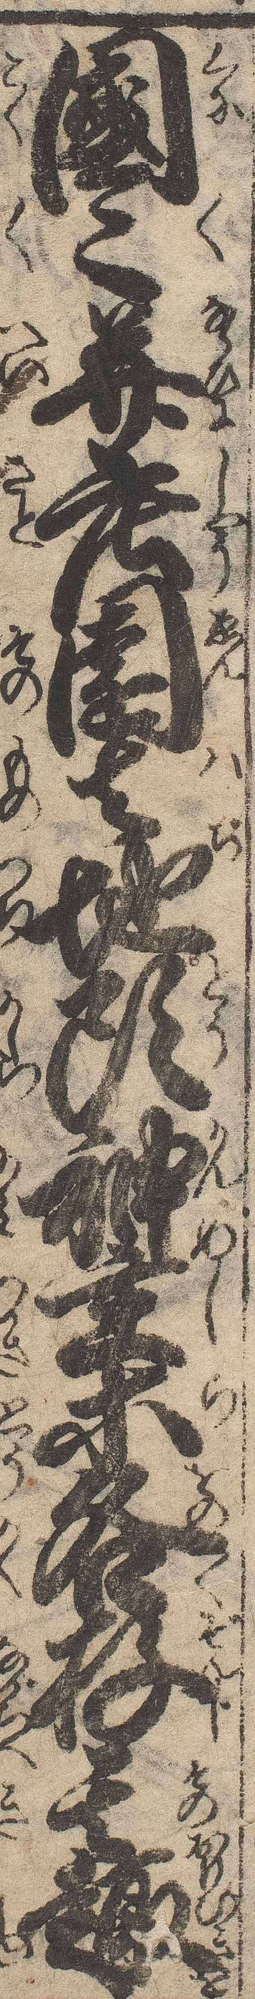國々并庄園者地頭神主等各存其趣
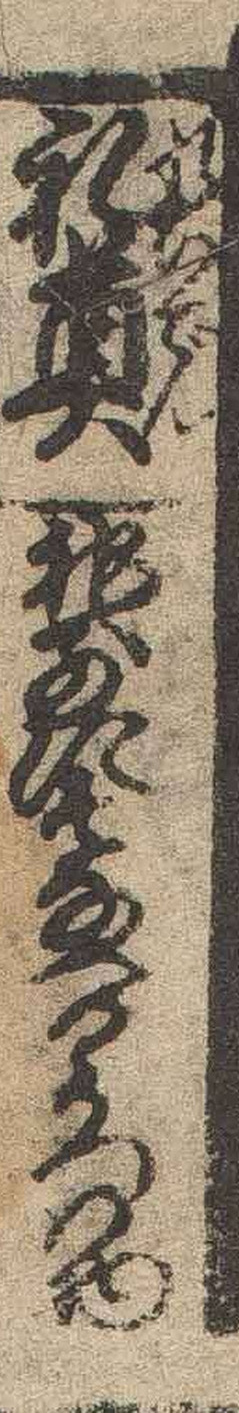礼奠神前にそなへるうつは物
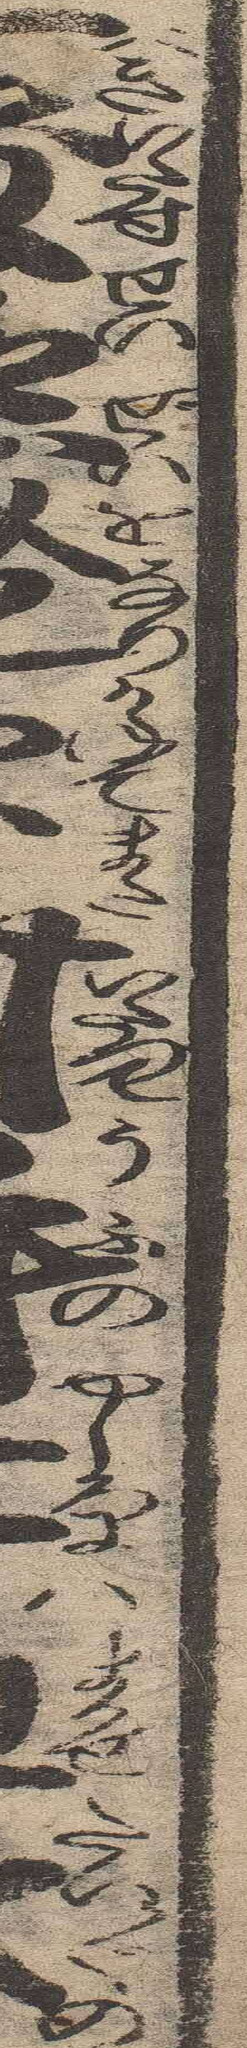べきいたすせいぜいをなりかねてまたいたつてうふのやしろにはまかせたい〴〵の
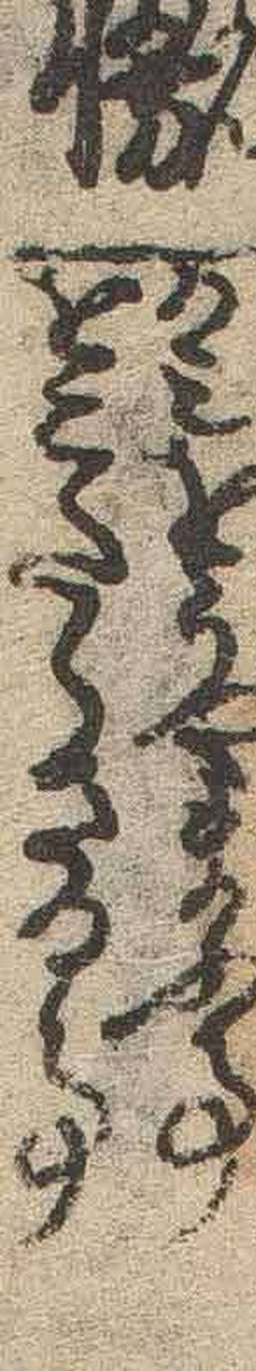をこたらさる事
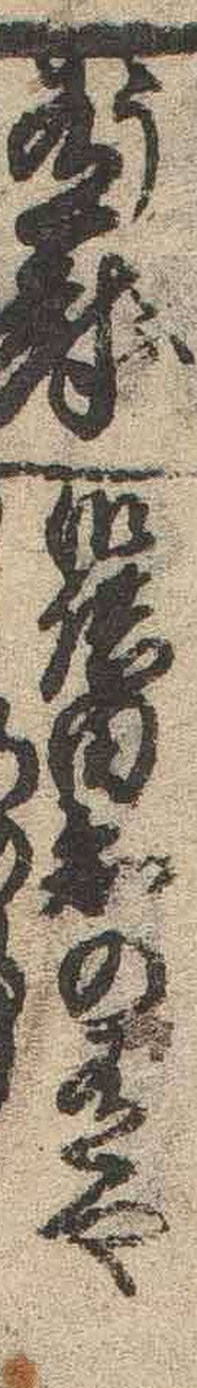有封御供田知の有や
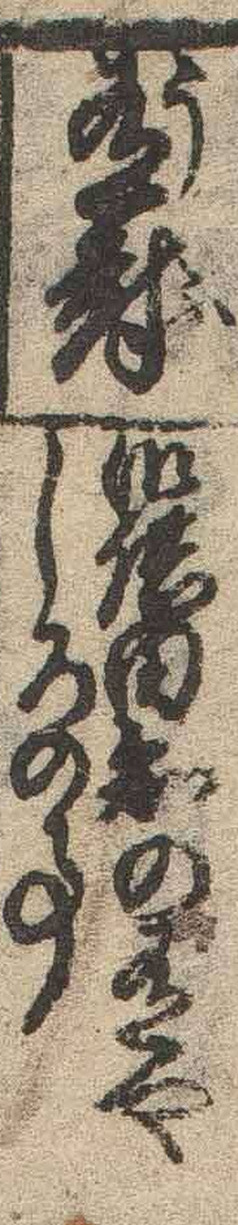有封御供田知の有や
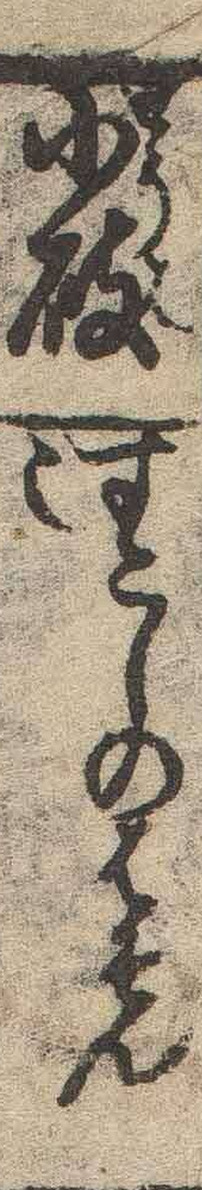小破すこしのはそん
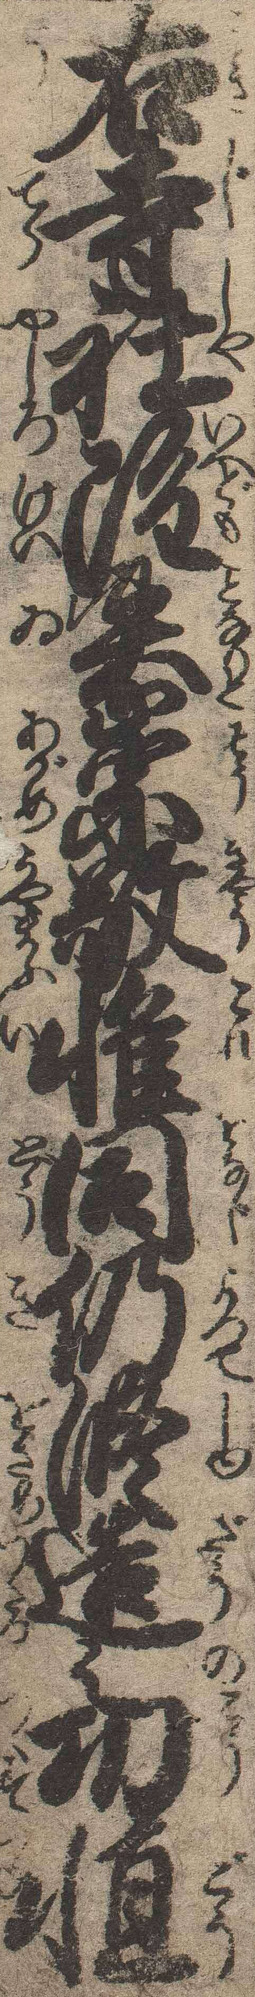右寺社雖異崇敬惟同仍修造之功恒

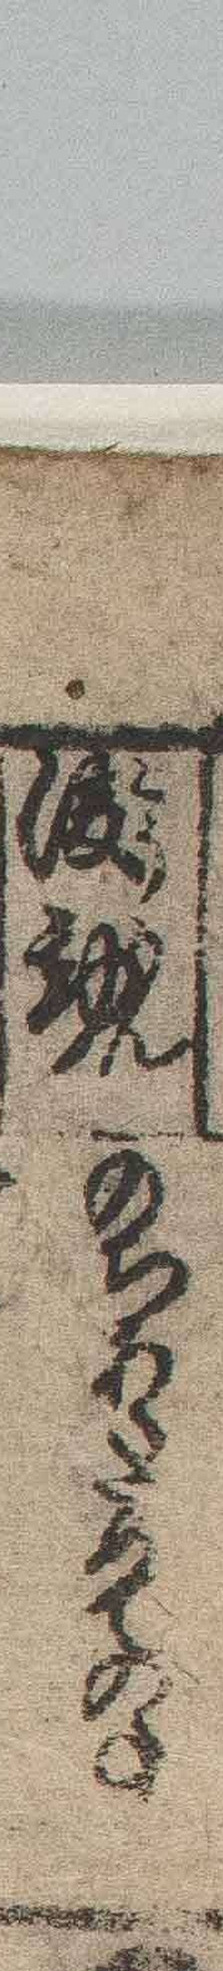後勘のちあらためての事
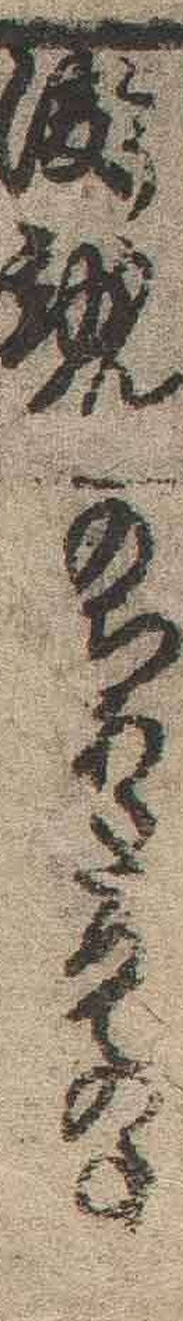後勘のちあらためての事
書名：御成敗式目絵抄
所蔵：東京学芸大学附属図書館 国文学研究資料館
